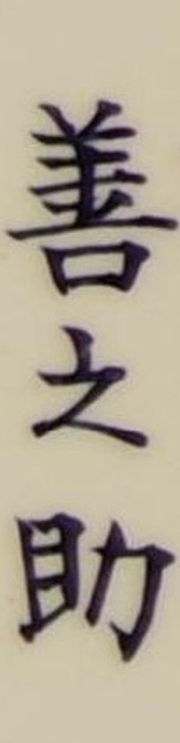善之助
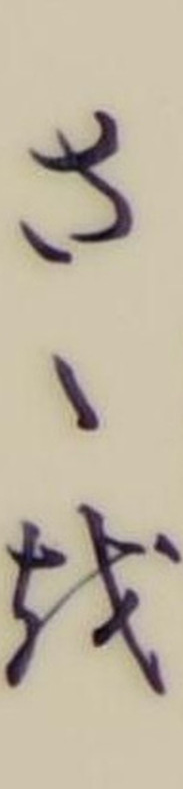さゝを
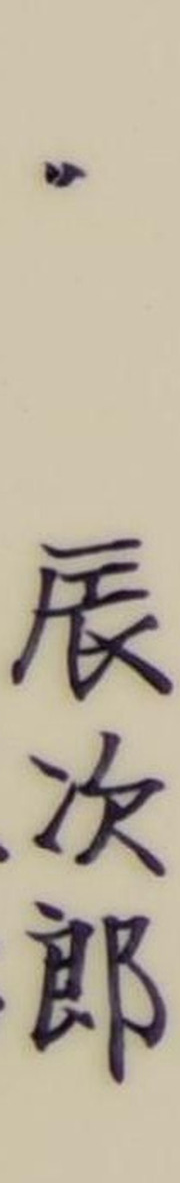辰次郎
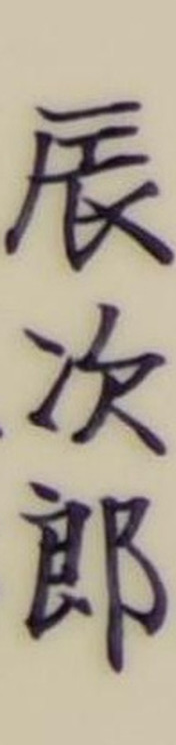辰次郎

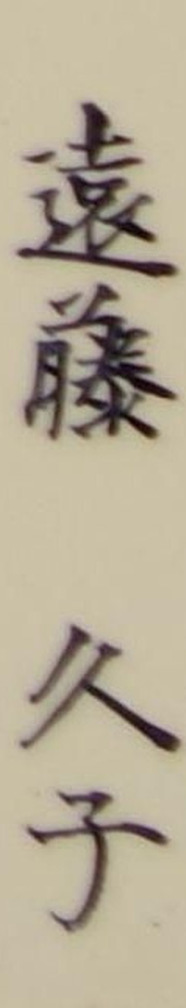遠藤久子
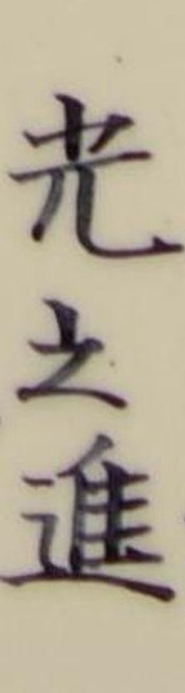光之進
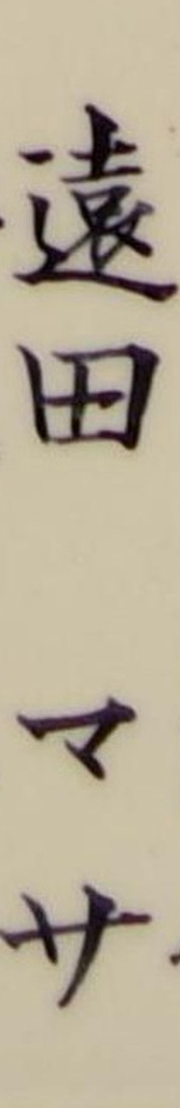遠田マサ
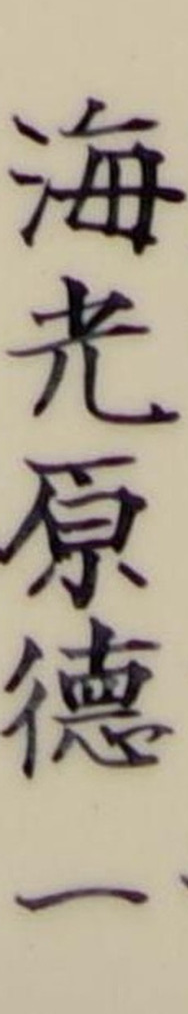海光原徳一
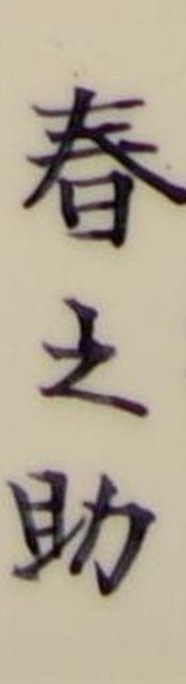春之助
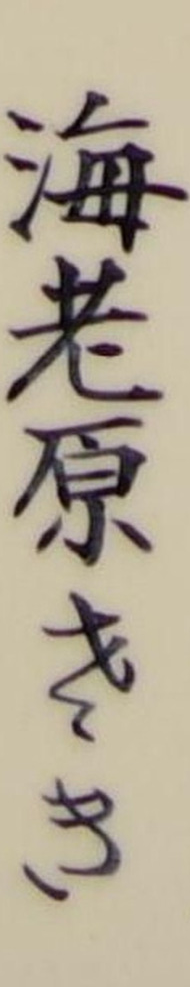海老原さき
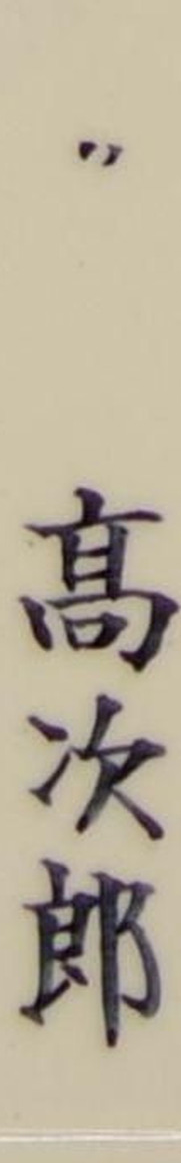高次郎
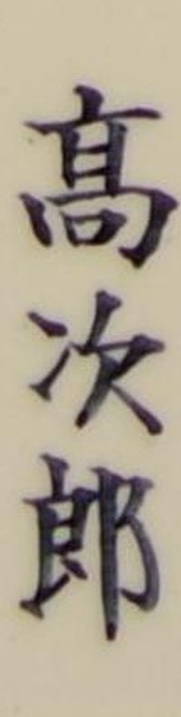高次郎
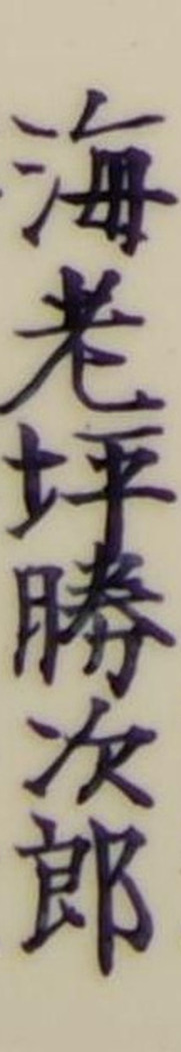海老坪勝次郎
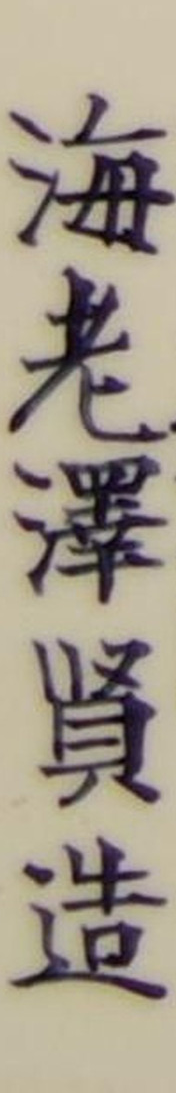海老沢賢造

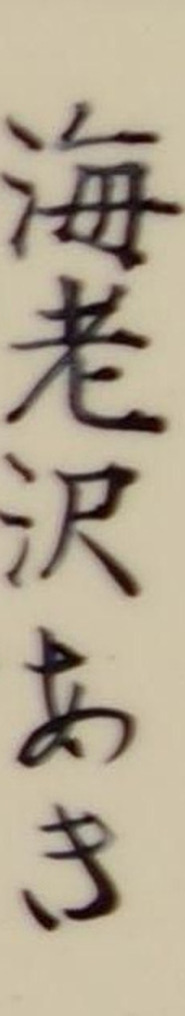海老沢あき
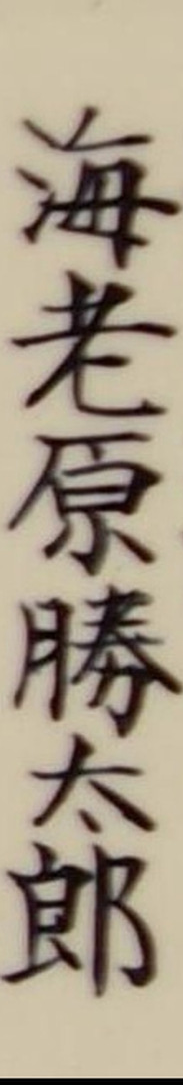海老原勝太郎
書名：E~L
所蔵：高野山金剛峯寺
